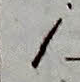1
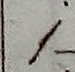1
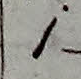1
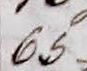65
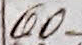60
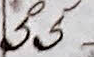55
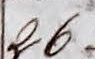26
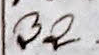32
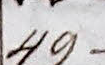49
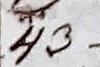43
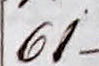61
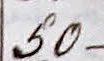50
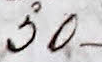50
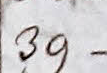39
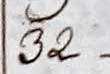32
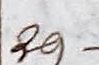29
